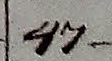47
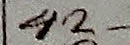42
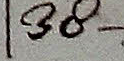38
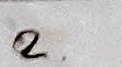2.
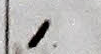1.
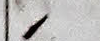1.
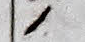1.
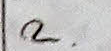2.
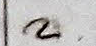2
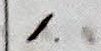1.
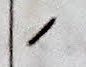1
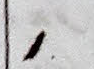1.
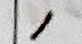1
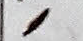1
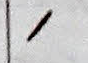1
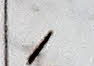1
